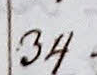34
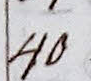40
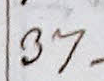37
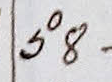58
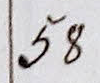58
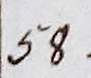58
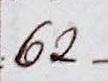62
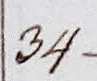34
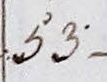53
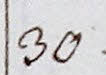30
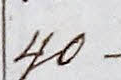40
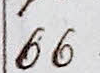66
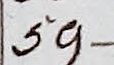59
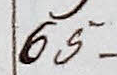65
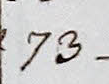73
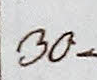30
